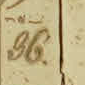36.
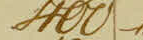400
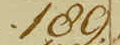189.
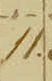11.
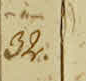32.
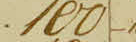100
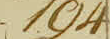194
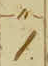1.
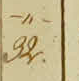32.
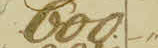600.
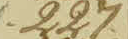227.
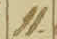11.
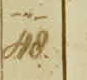48.
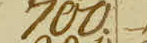700.
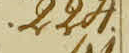224.
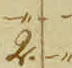2.
